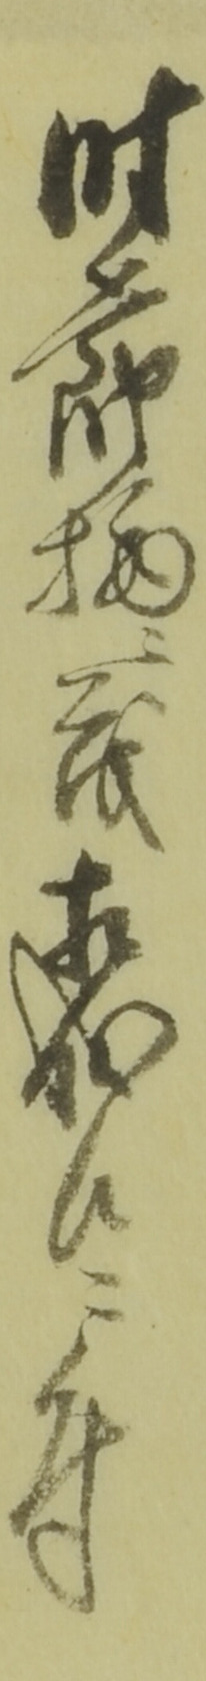時節柄ニも相成候ニ付
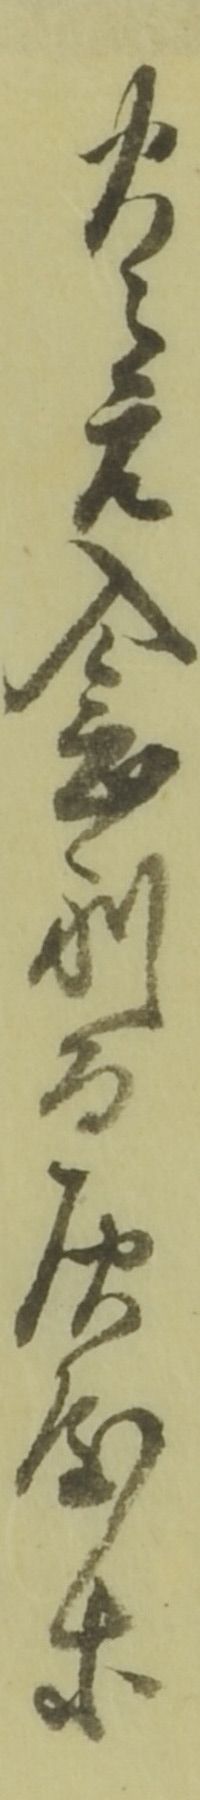火之元入念別而灰屋等
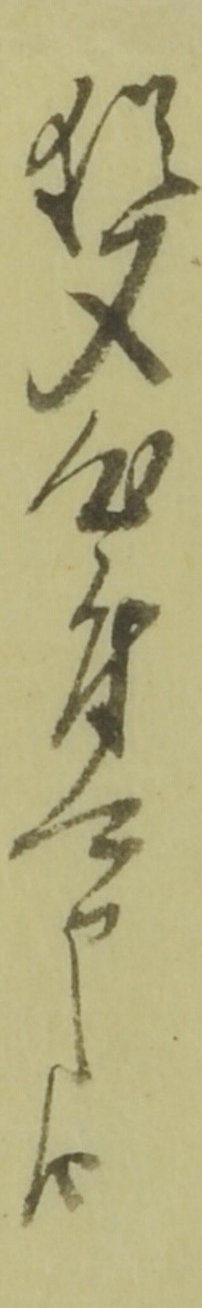猶又心付可申候

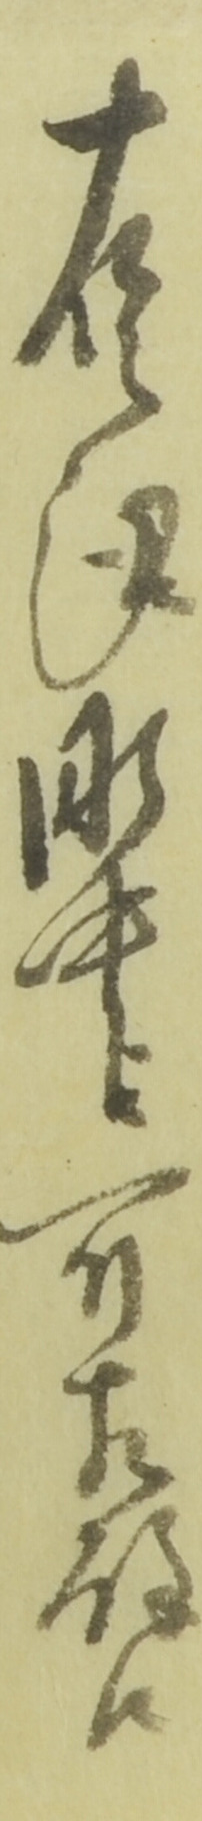右之趣町中江可相触候
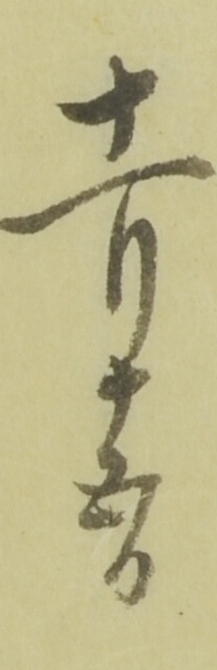十一月十五日
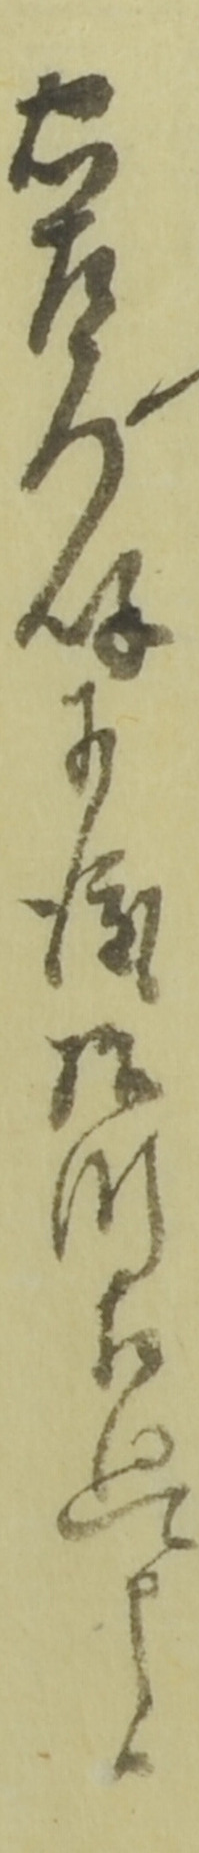右左衛門呼相渡拾町相廻シ申候
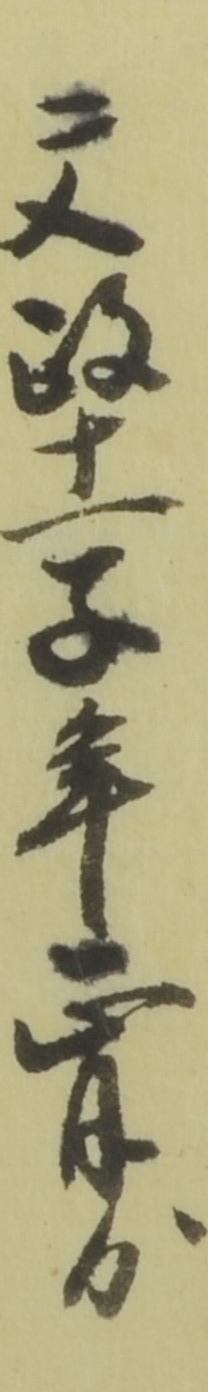文政十一子年正月ゟ
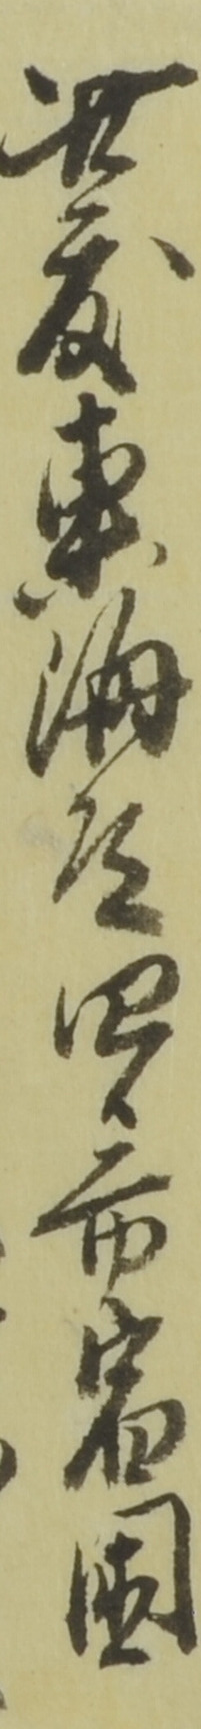此度東海道四日市宿困
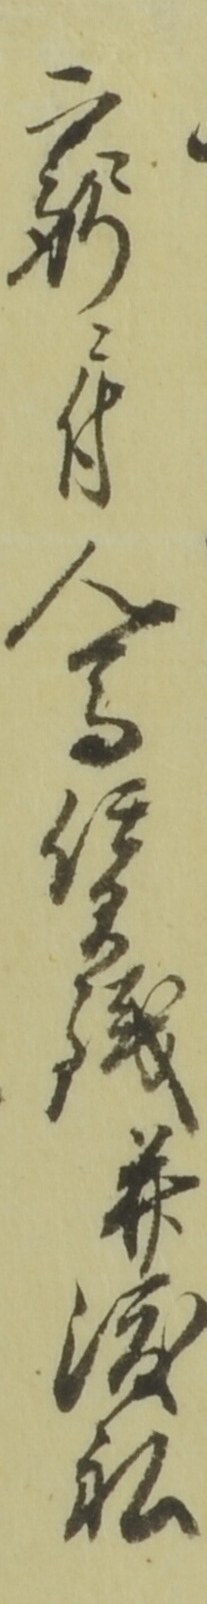窮ニ付人馬賃銭并渡船
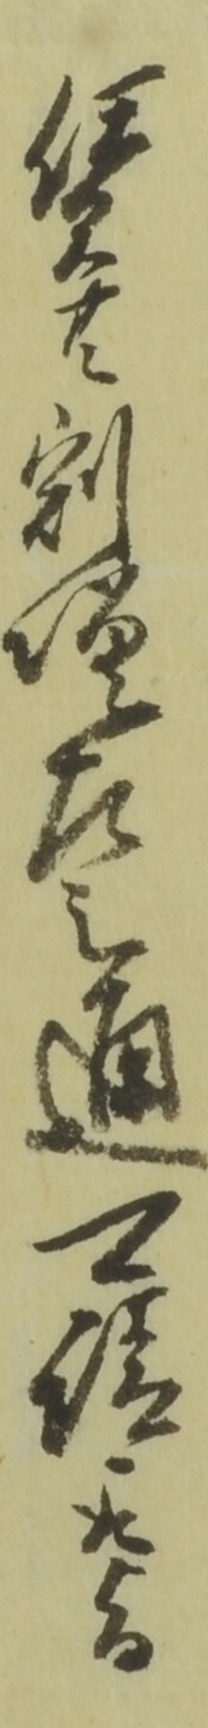賃共割増左之通可請取旨
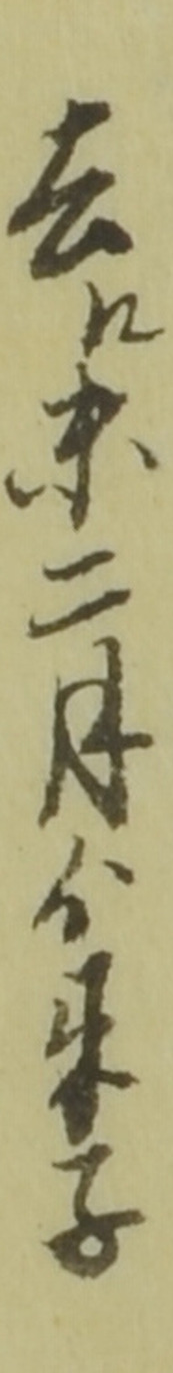去ル未二月ゟ来子
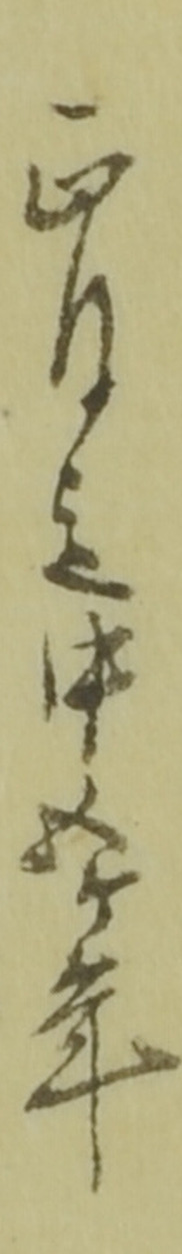巳正月迄中五ヶ年
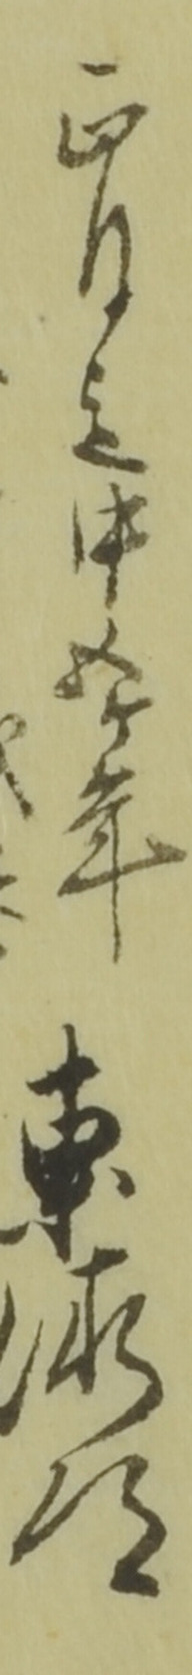正月迄中五ヶ年東海道
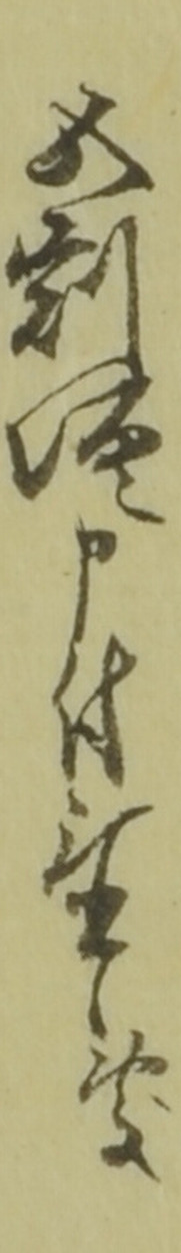五割増申付置候処
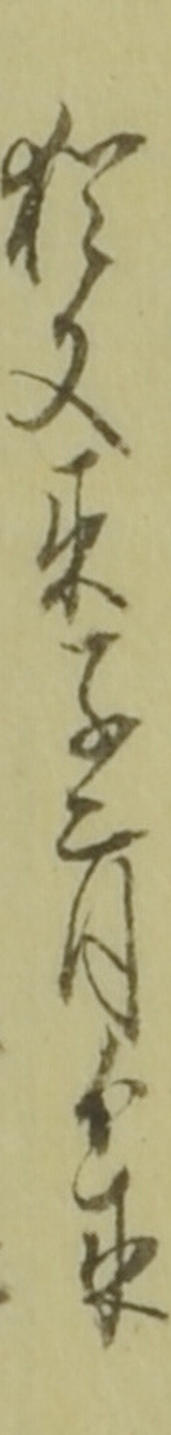猶又来子二月ゟ来
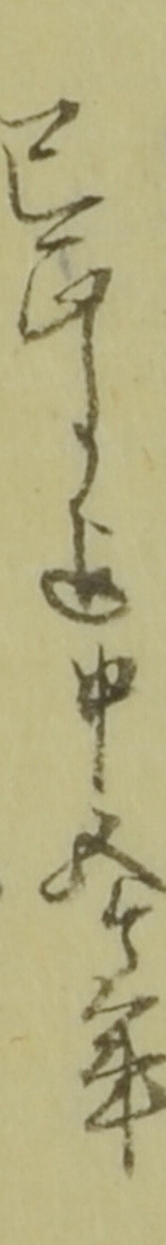巳正月迄中五ヶ年
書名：御触書御書附控
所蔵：伊那市立高遠町図書館・合同会社AMANE
